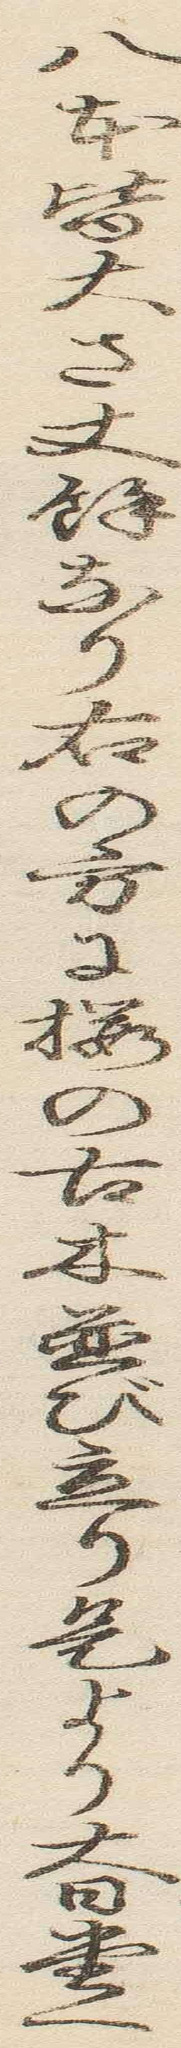八本皆大さ丈餘なり右の方に桜の古木並び立り是より大日堂へ
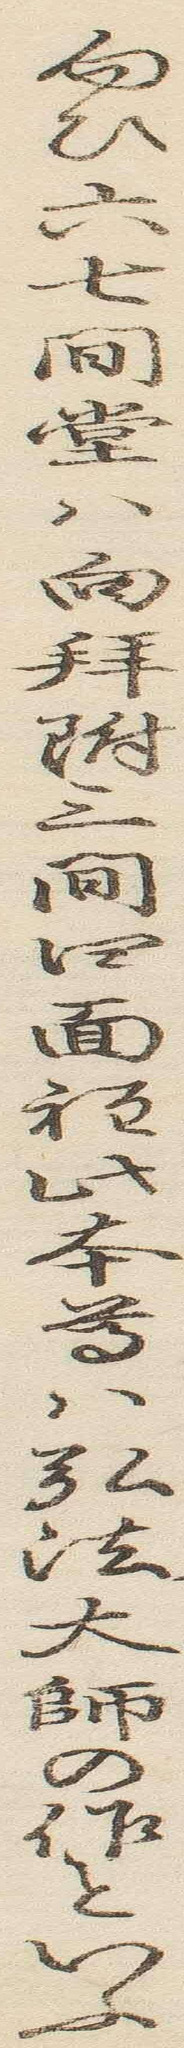向ひ六七間堂は向拜附三間四面程此本尊は弘法大師の作といふ
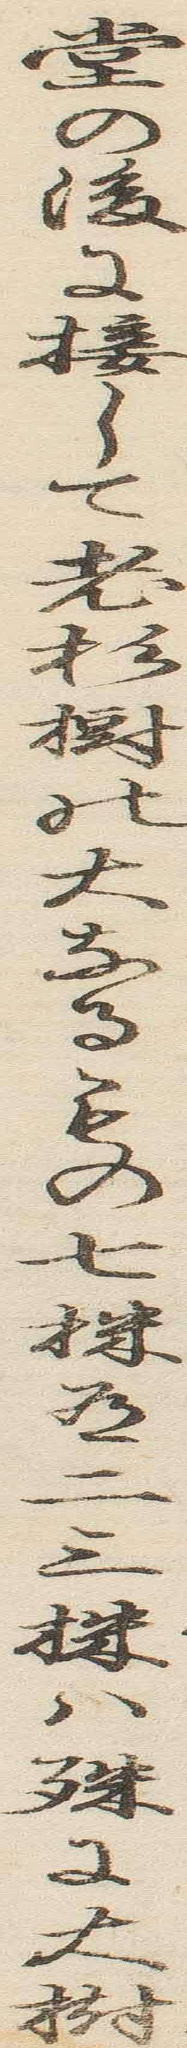堂の後に接して老杉樹の大なるもの七株有二三株は殊に大樹
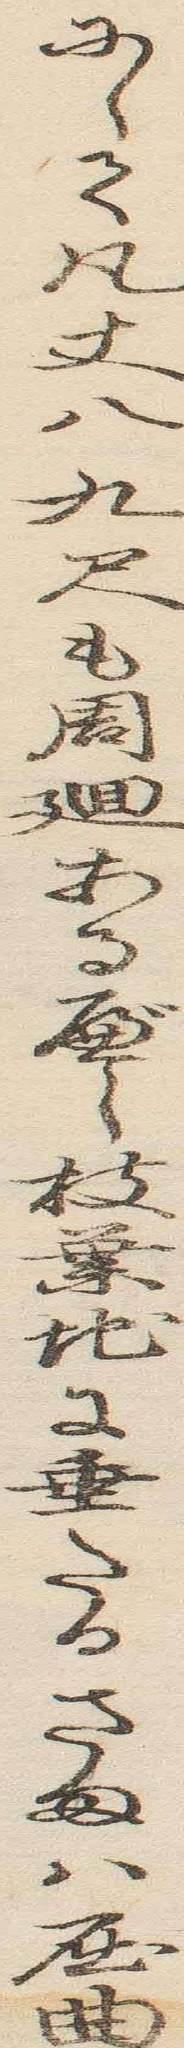にして凡丈八九尺も周廽あるべし枝葉地に垂たるさまは屈曲
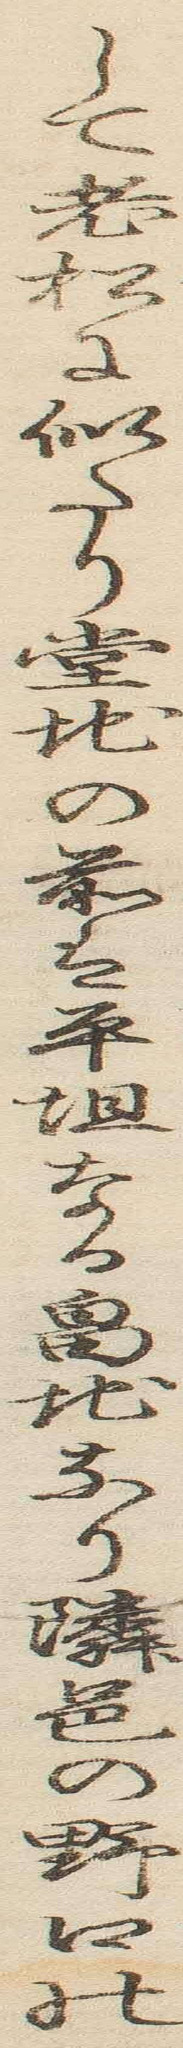して老松に似たり堂地の前は平坦なる畠地なり隣邑の野口の
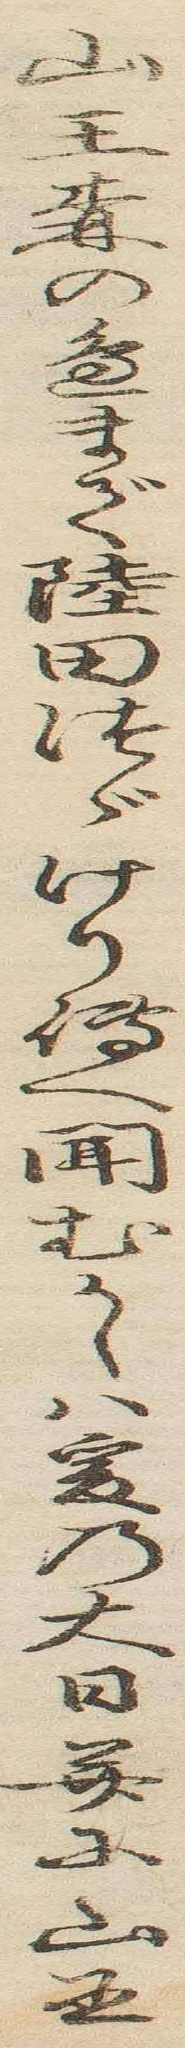山王森の邊まで陸田つゞけり傳へ聞むかしは爰の大日并に山王
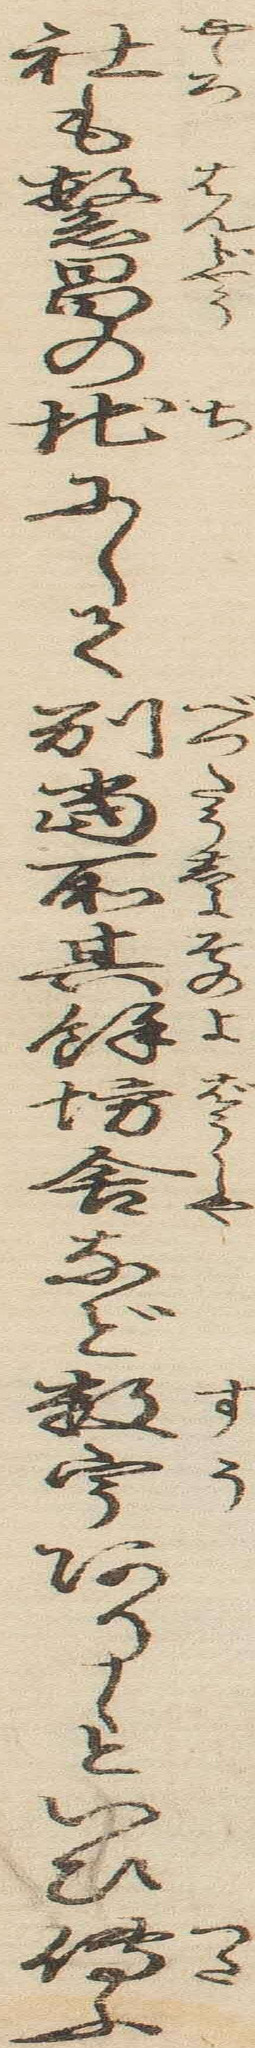社も繁昌の地にして別當所其餘坊舍など数宇ありしといひ傳ふ

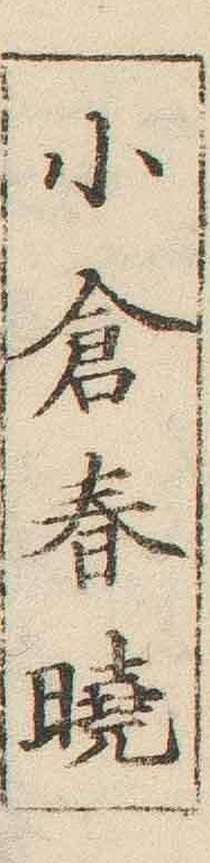小倉春曉

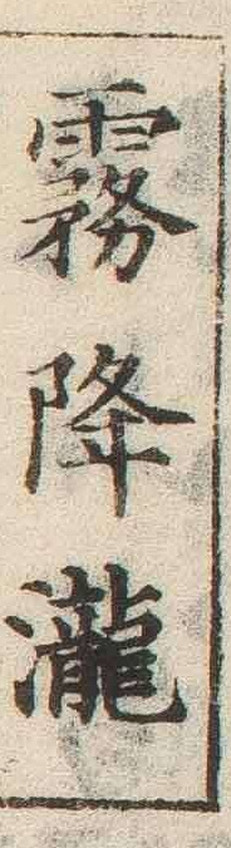霧降瀧
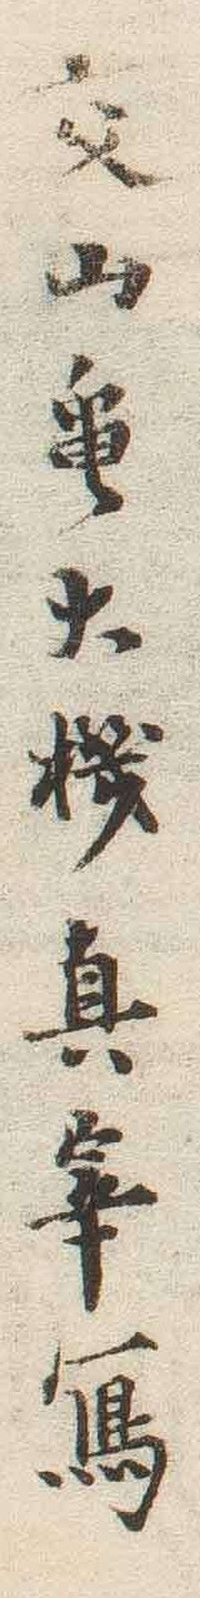交山亀大機真宰冩

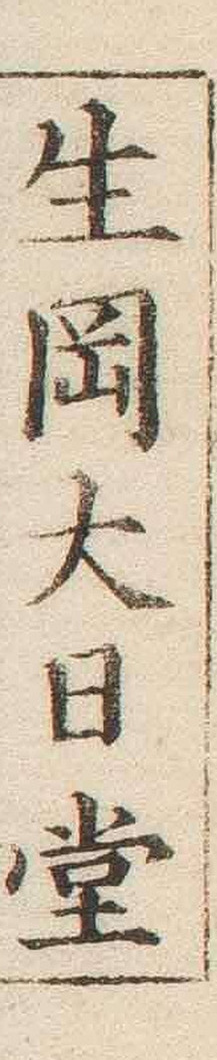生岡大日堂
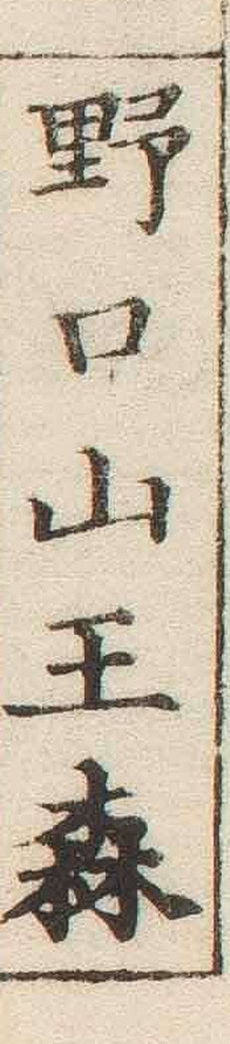野口山王森
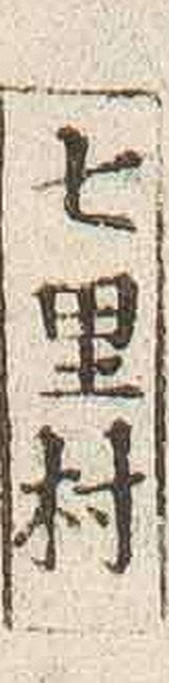七里村
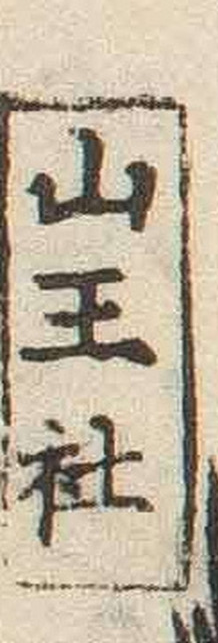山王社

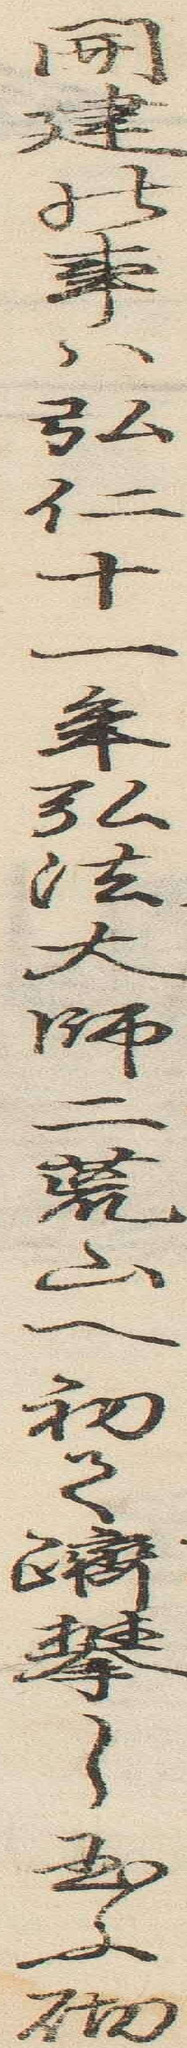開建の事は弘仁十一年弘法大師二荒山へ初て躋攀し玉ふ砌
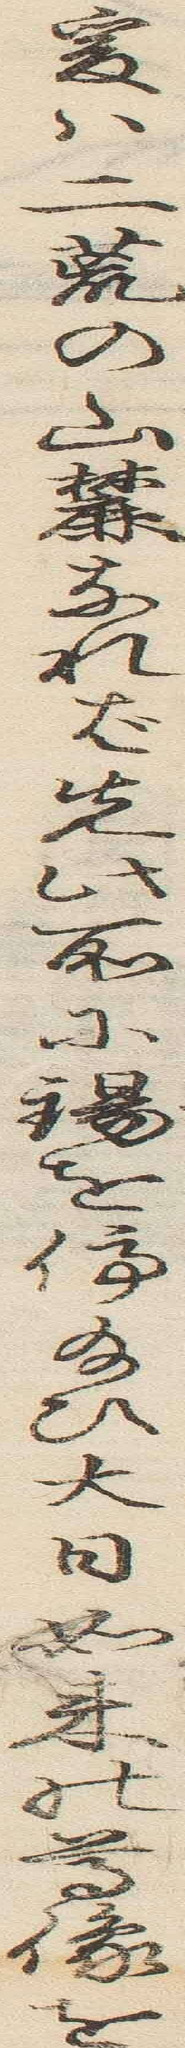爰は二荒の山麓なれば先此所に錫を停給ひ大日如來の尊像を
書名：日光山志
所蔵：東京学芸大学附属図書館 国文学研究資料館
